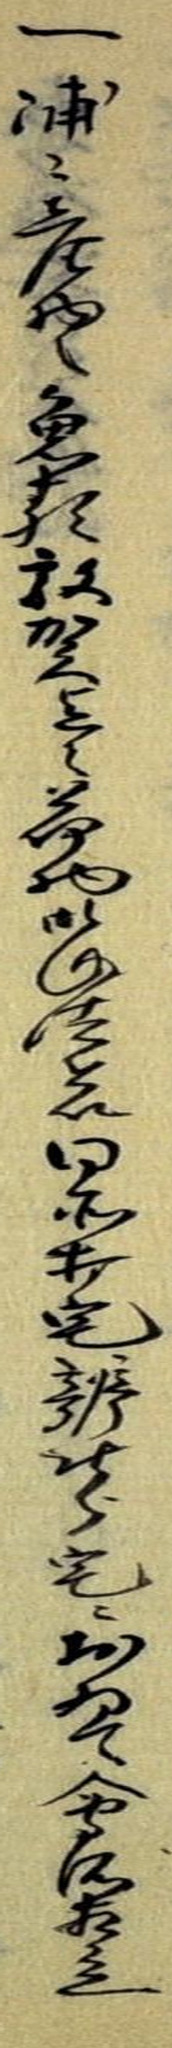一浦々産物之魚類敦賀迄之荷物御趣法を以同所打宅弁次郎宅ニおゐて会所相立
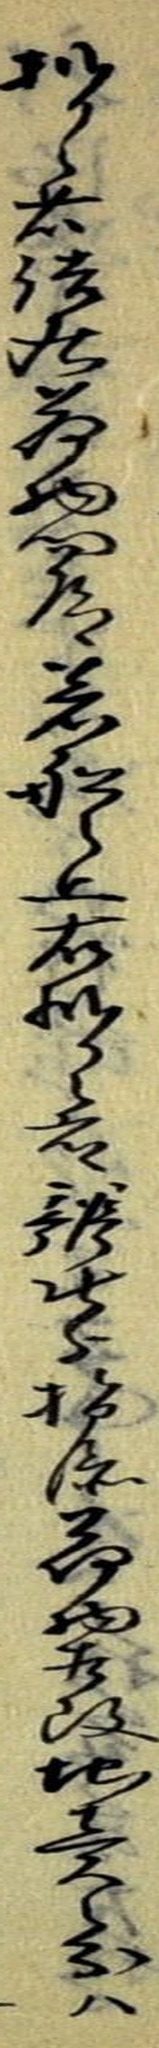掛り之者詰居荷物問屋へ着船之上右掛り之者へ弁次郎指添荷物相改地売之分ハ
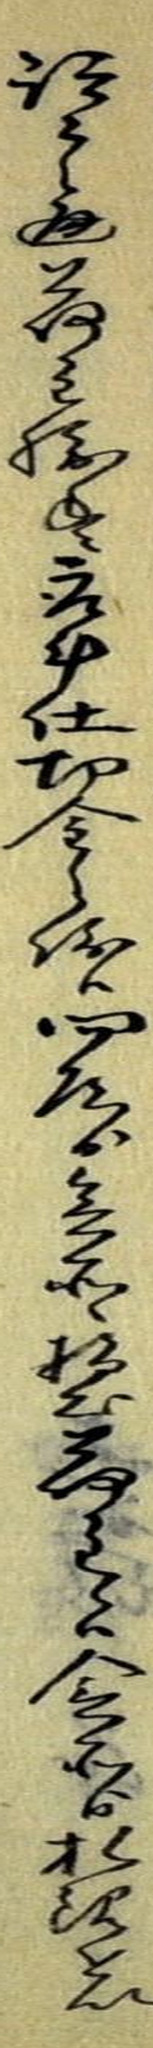跡々之通り荷主勝手ニ取計仕切金之儀ハ問屋ゟ会所へ指出荷主候ハ会所ゟ札銀を以
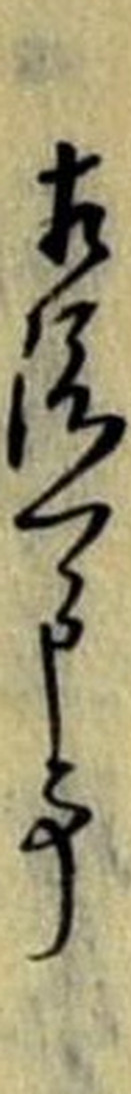相渡可申事
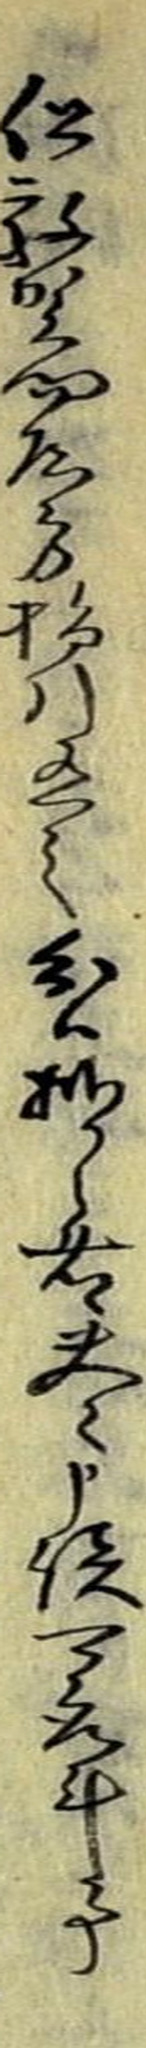但敦賀問屋方指引有之分ハ掛り之者夫々申談可取計事
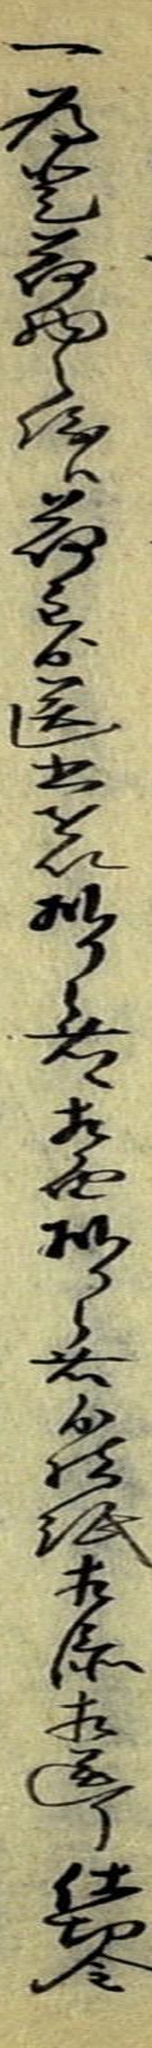一為登荷物之儀ハ荷主ゟ送書を以掛り之者へ相届掛り之者ゟ指紙相添相送り仕切金
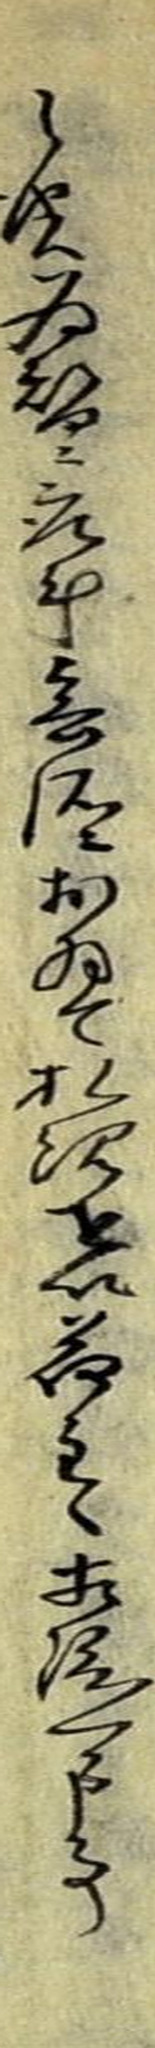之儀ハ為替ニ取計会所ニおゐて札銀を以荷主へ相渡可申事
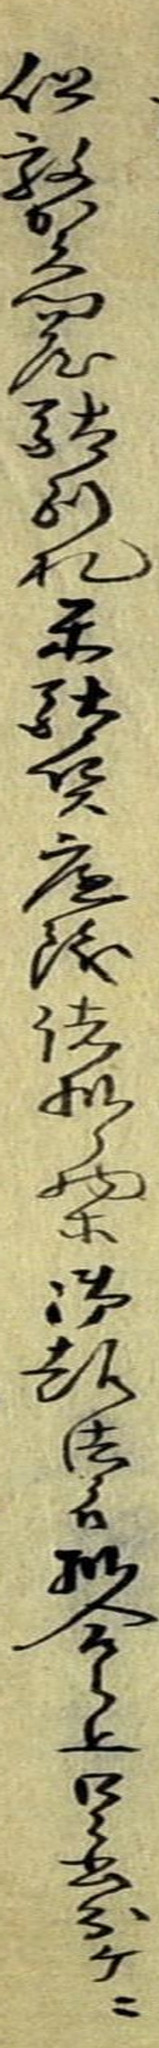但敦賀問屋駄別札米駄賃庭銭諸掛り物等御趣法ニ付掛合之上口々書分ケニ
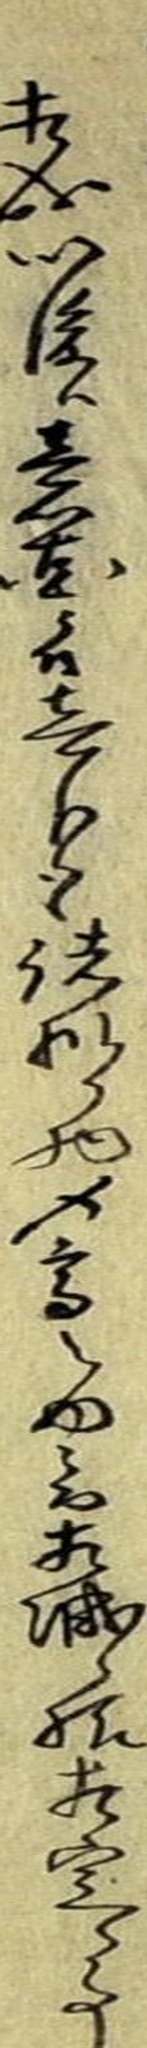相成以後ハ壱箇ニ付壱歩ツヽ諸掛り物〆高之内ニ而相減候様相定候事
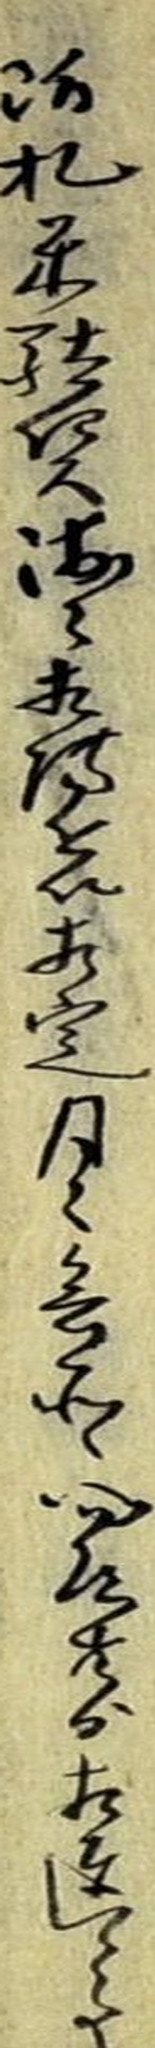附札米駄賃浦々相場を以相定月々会所へ問屋共ゟ相達候事
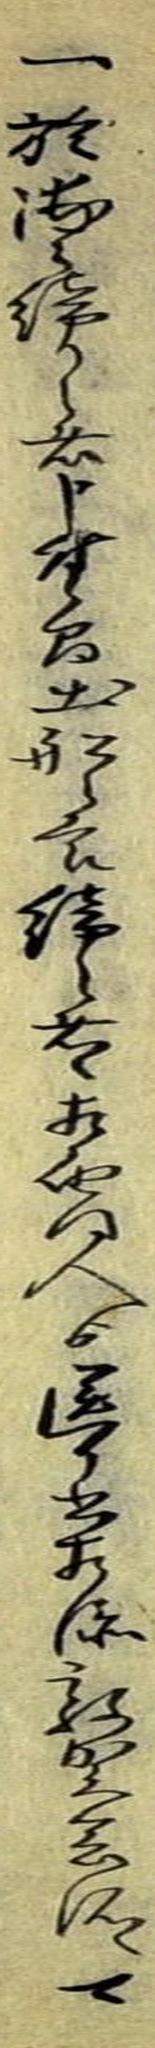一於浦々締り之者申付候間出船之節締之者へ相届同人ゟ送り書相添敦賀会所へ可
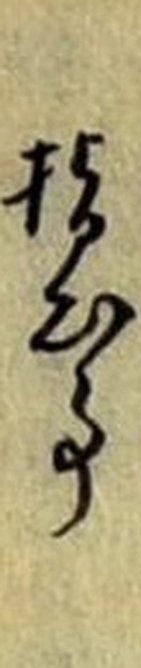指出事
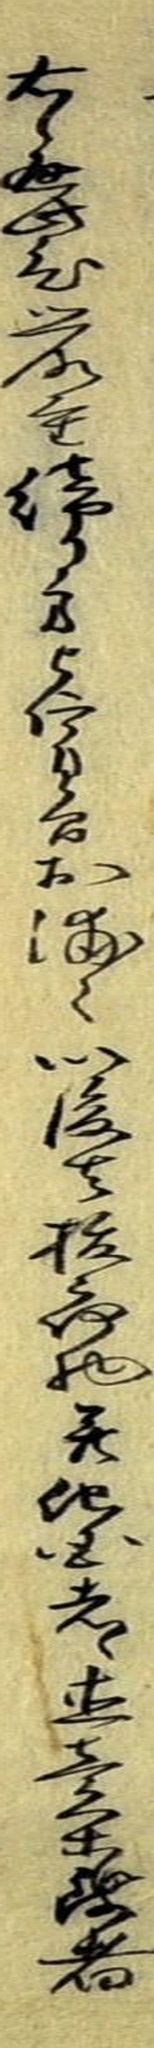右之通此度厳重締方被仰付候間於浦々以後者抜荷物并他国者へ直売等致者
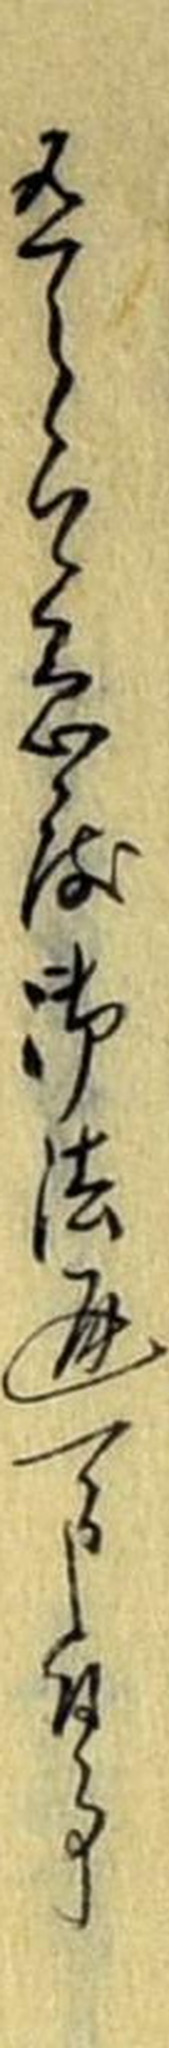有之候ハヽ急度御法通可申付事

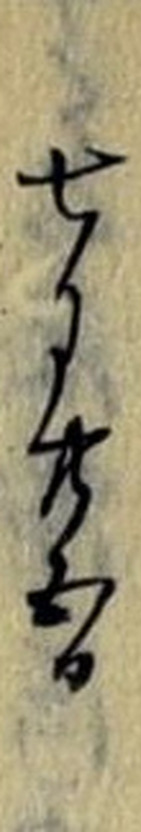七月廿五日
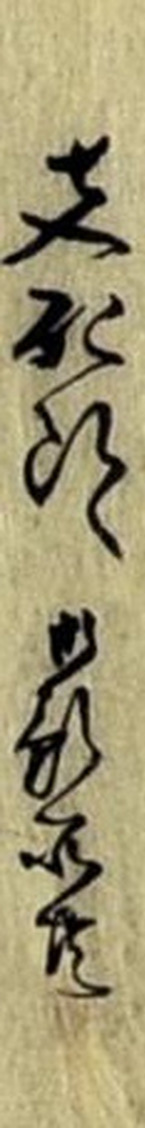支配頭へ御預所共
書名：命令之部 五
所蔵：福井県文書館 Fukui Prefectural Archives
